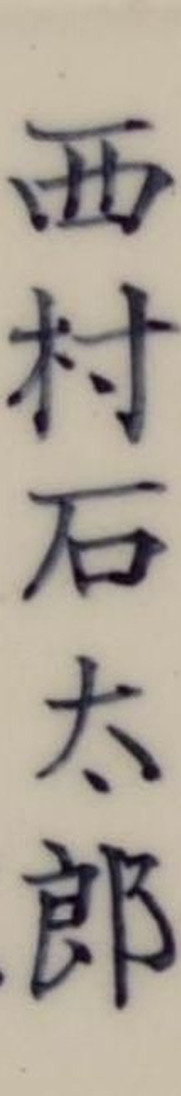西村石太郎
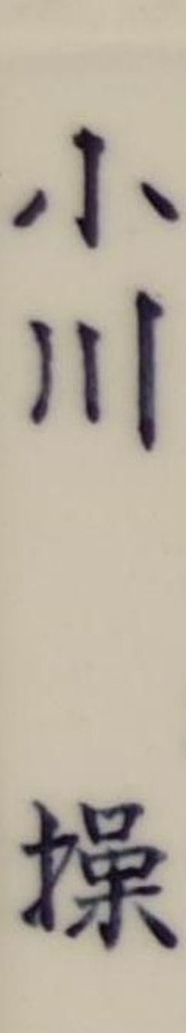小川操

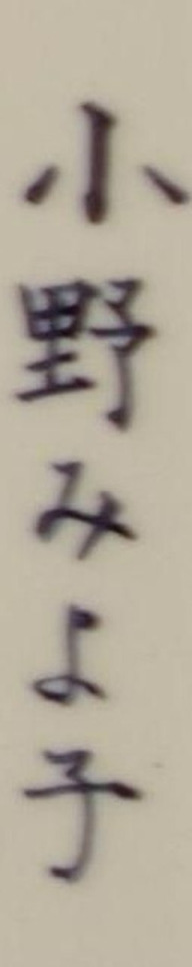小野みよ子
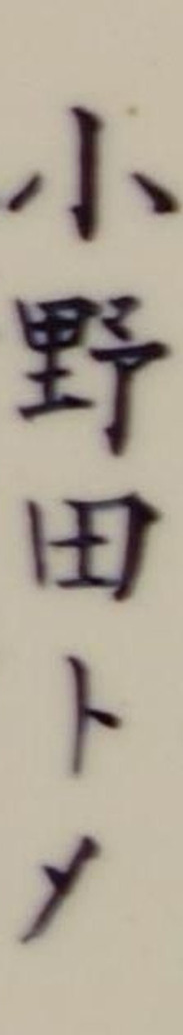小野田トメ
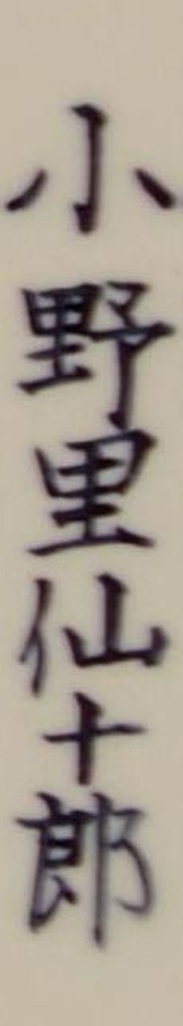小野里仙十郎
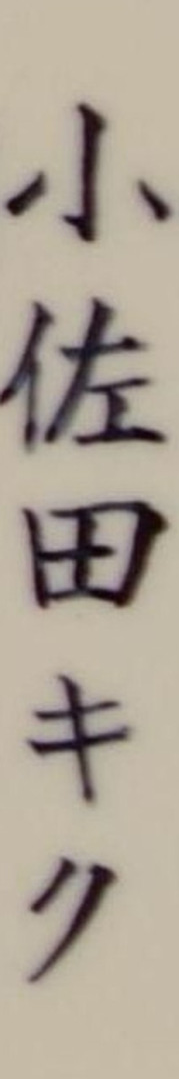小佐田キク
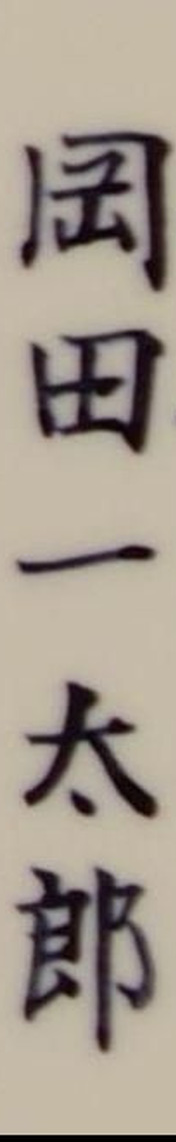岡田一太郎
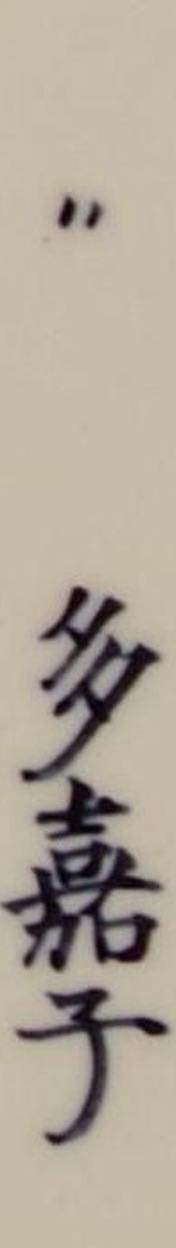多嘉子
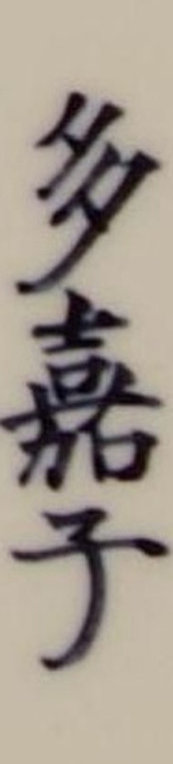多嘉子
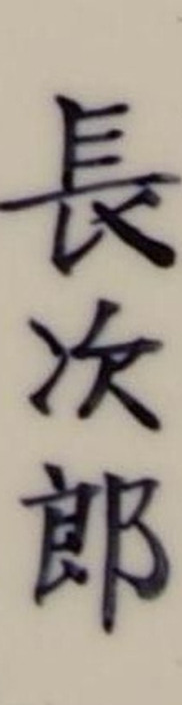長次郎
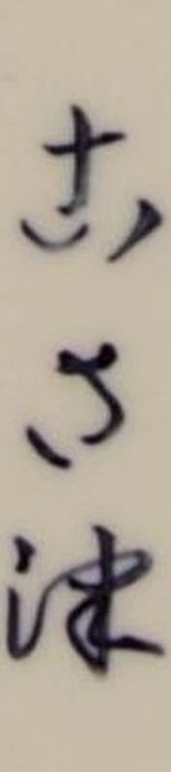こさつ
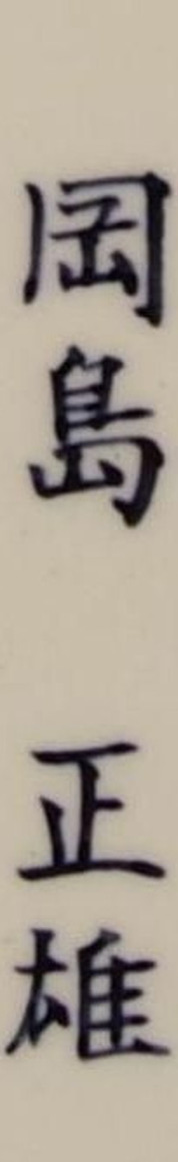岡島正雄
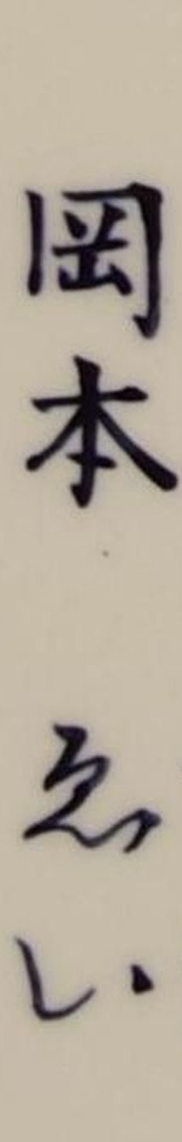岡本ゑい
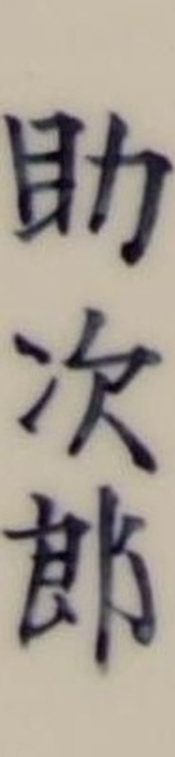助次郎
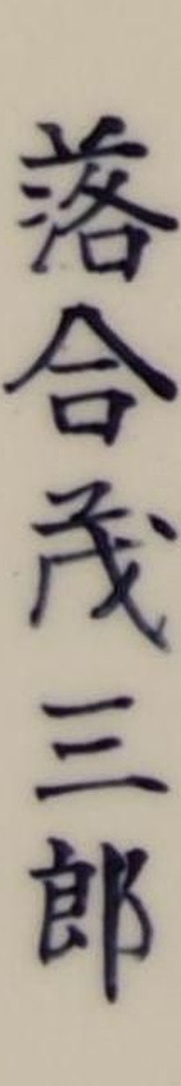落合茂三郎
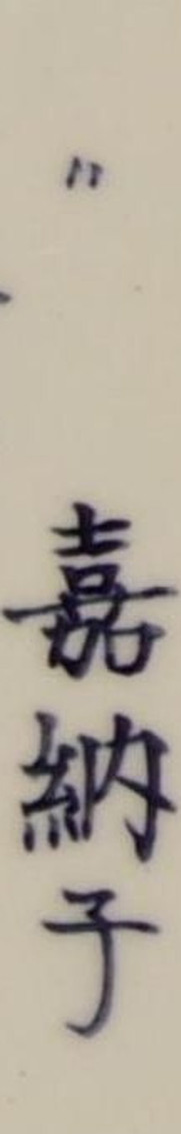嘉納子
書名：M~S
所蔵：高野山金剛峯寺
